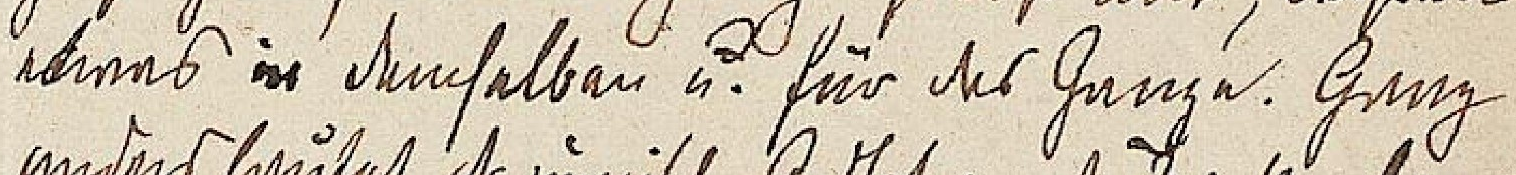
etwas in demselben u. für das Ganze. Ganz
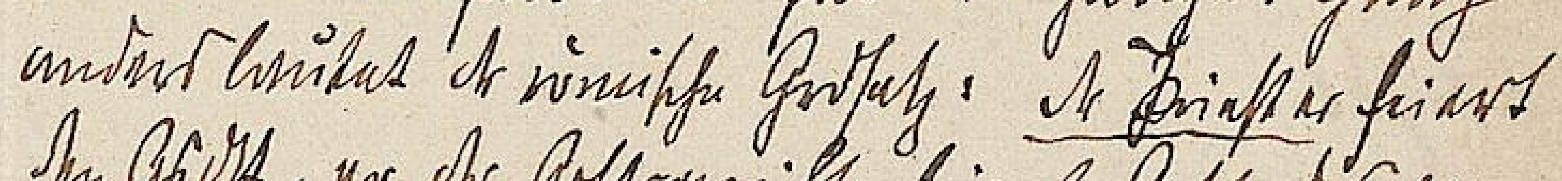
anders lautet der römische Grdsatz: die Priester feiert
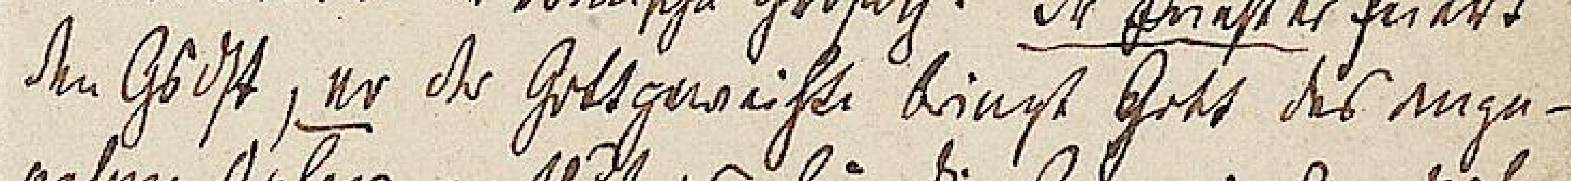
den Gsdst, er der Gottgeweihte bringt Gott das ange¬
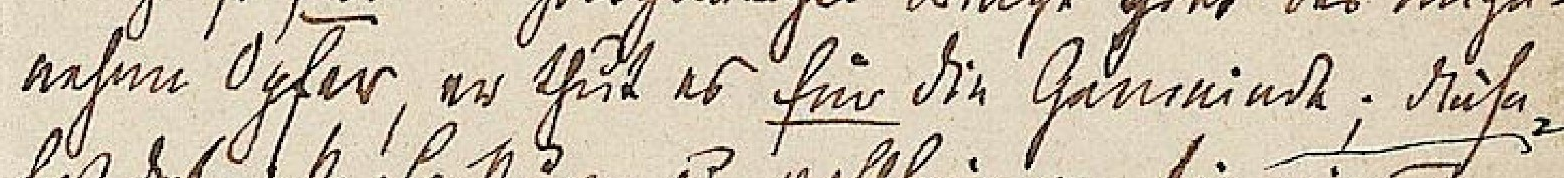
nehme Opfer, er thut für die Gemeinde. diese
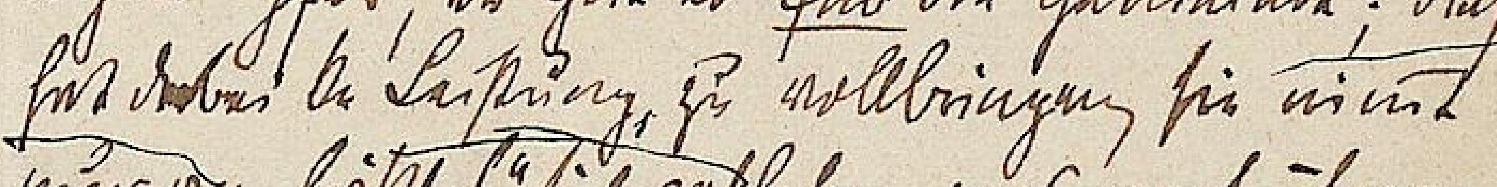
hat dabei kn Leistung zu vollbringen, sie nimt
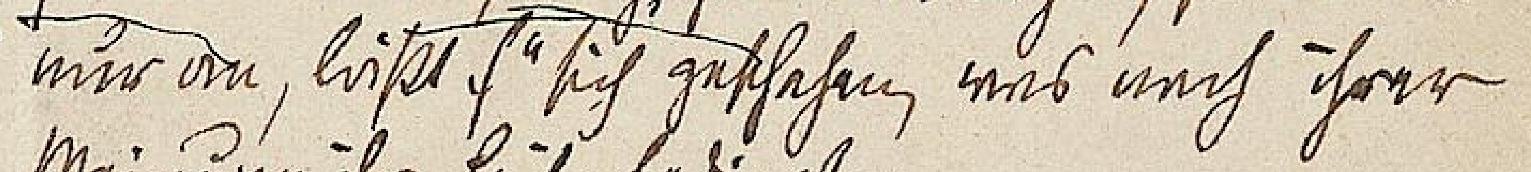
nur an, läßt fü sich geschehen, was nach ihrer
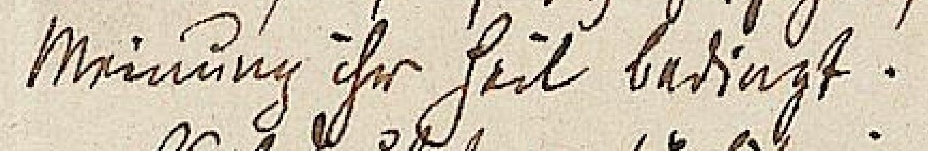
Meinung ihr Heil bedingt.
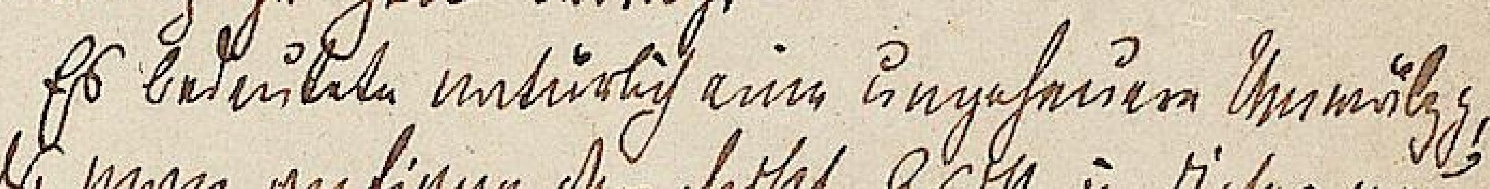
Es bedeutete natürlich eine ungeheuere Umwälzg,
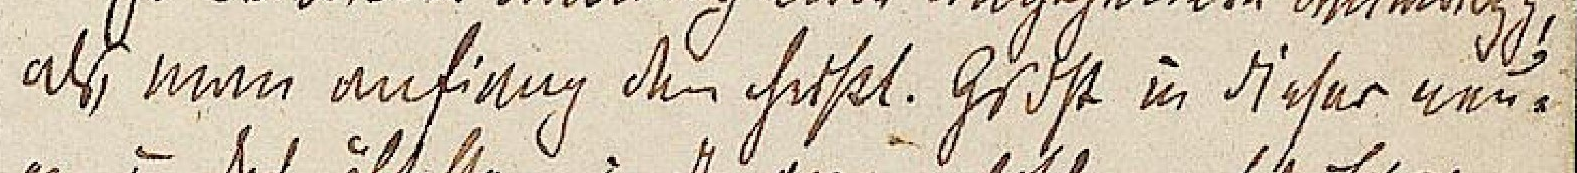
als man anfing den christ. Gsdst in dieser neu¬
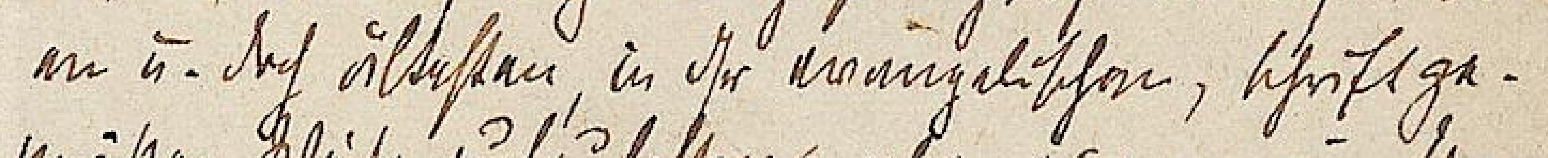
en u. doch ältesten, in der evangelischen, schriftgem¬
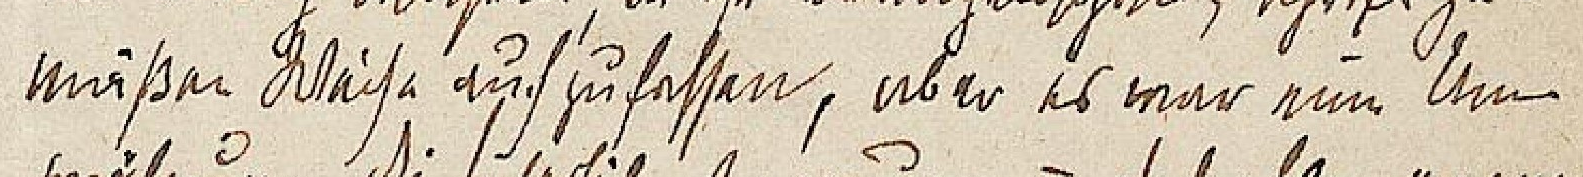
mäßen Weise aufzufassen, aber es war eine Um¬
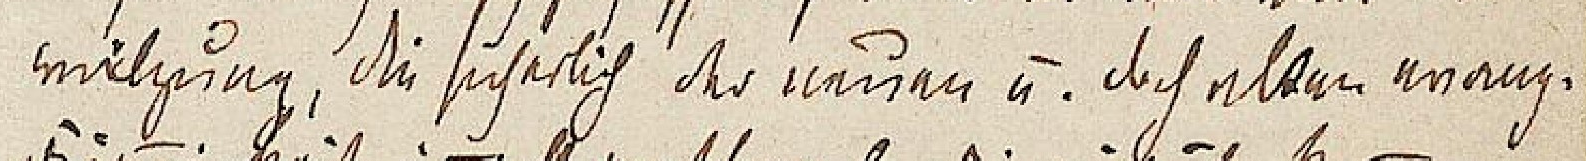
wälzung, die sicherlich der neuen u. doch alten evang.
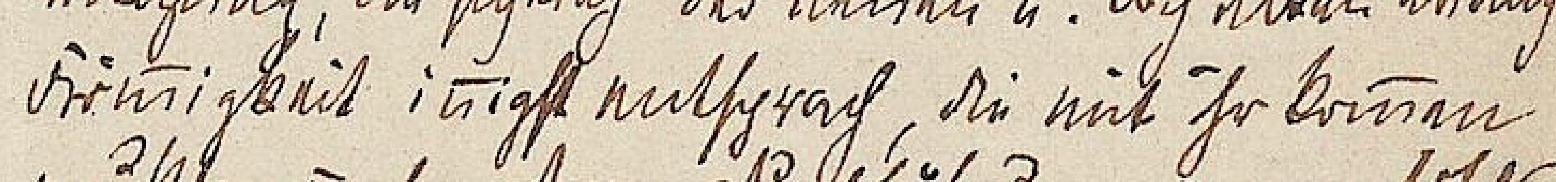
Frömigkeit inigst entsprach, die mit ihr kommen
